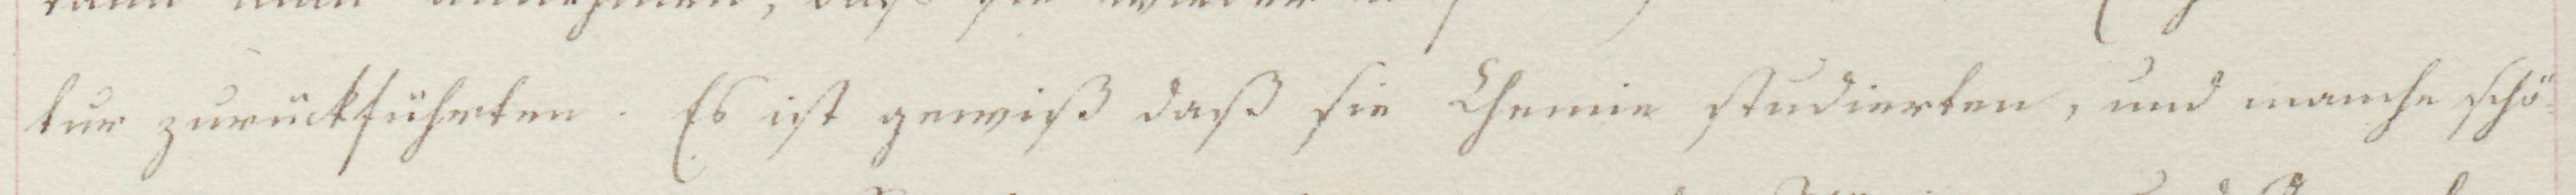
tur zurückführten. Es ist gewiß daß sie Chemie studirten, und manche schö-
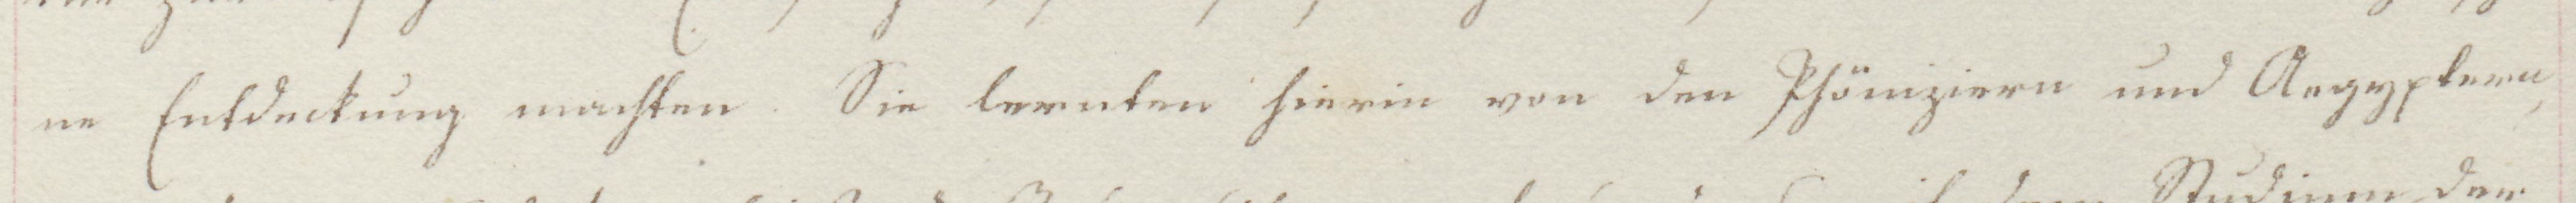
ne Entdeckung machten. Sie lernten hierin von den Phöniziern und Aegyptern,
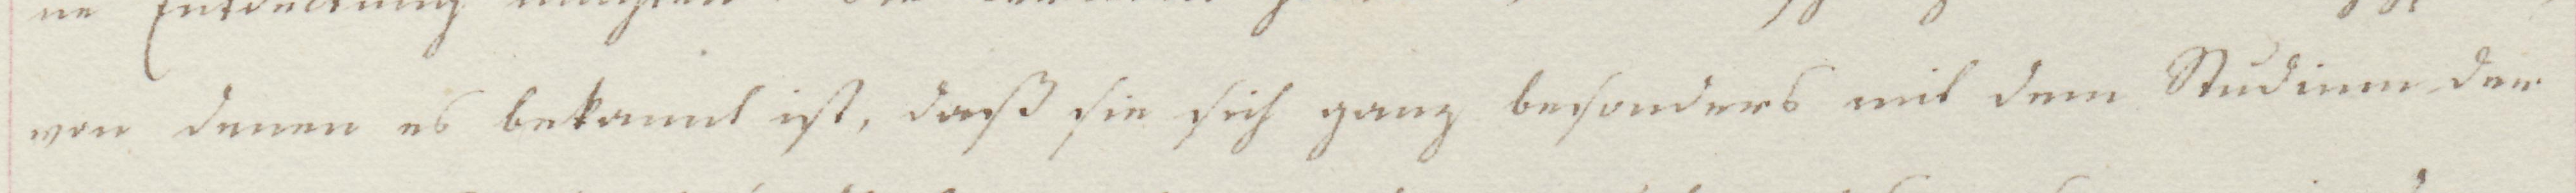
von denen es bekannt ist, daß sie sich ganz besonders mit dem Studium der
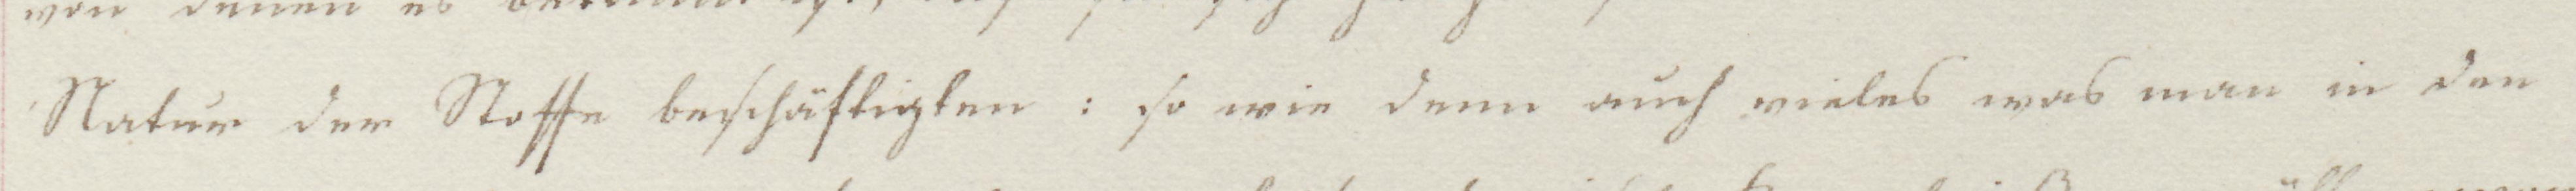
Natur der Stoffe beschäftigten: so wie denn auch vieles was man in den
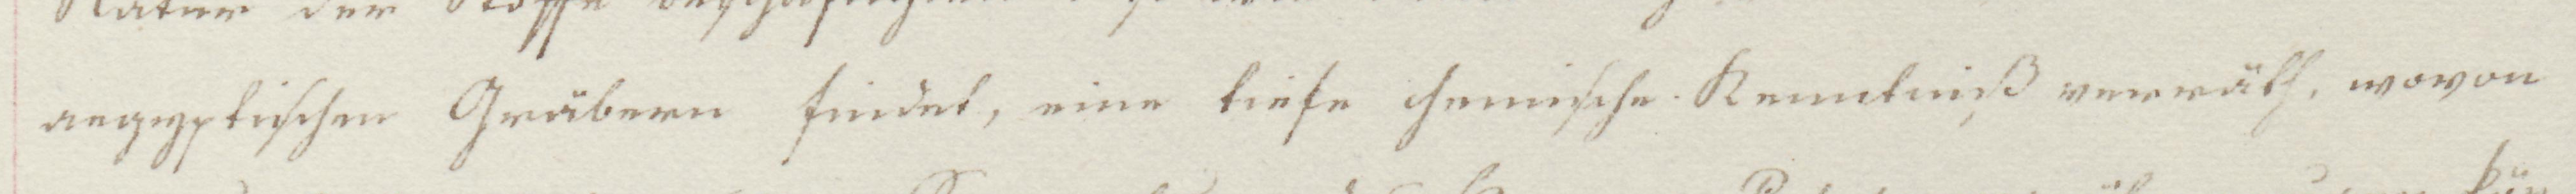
aegyptischen Gräbern findet, eine tiefe chemische Kenntniß verräth, wovon
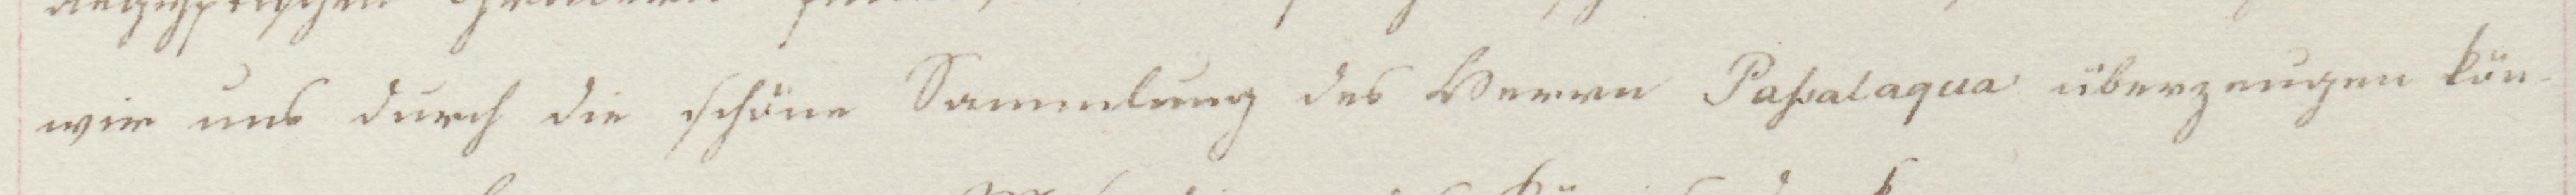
wir uns durch die schöne Sammlung des Herrn Passalaqua überzeugen kön-
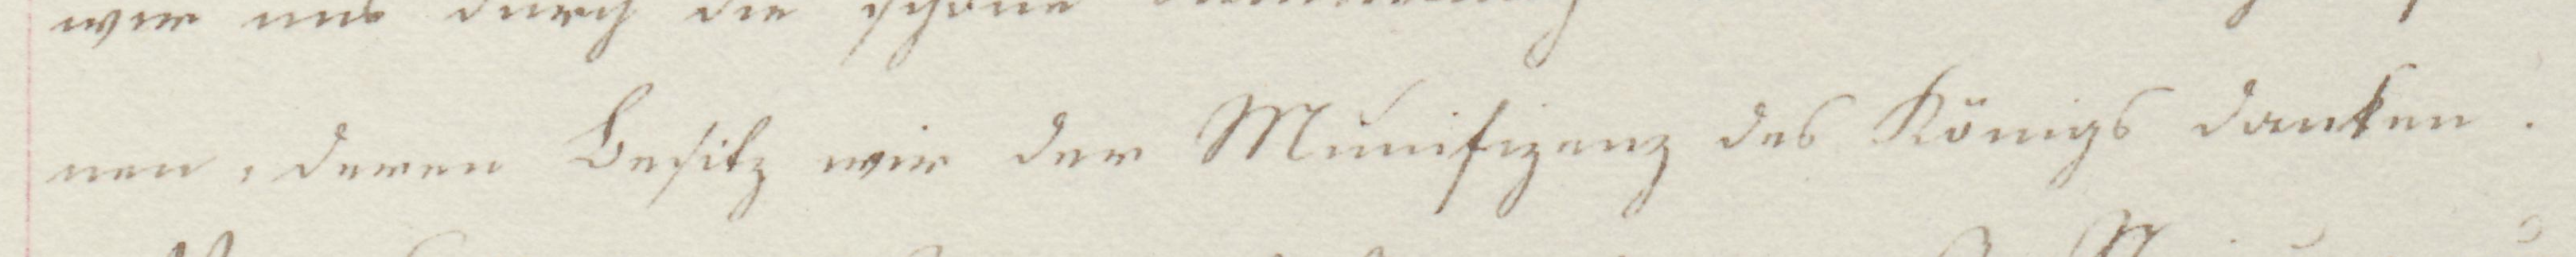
nen, deren Besitz wir der Munifizenz des Königs danken.
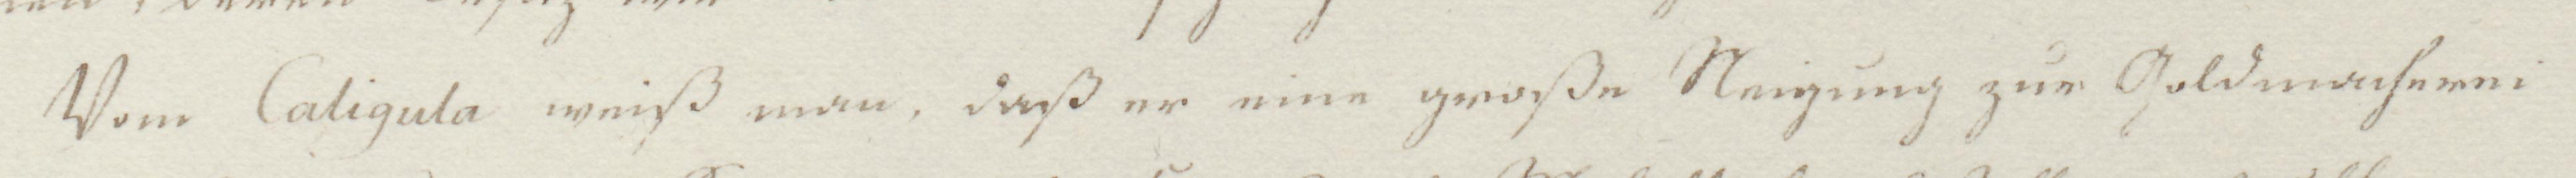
Vom Caligula weiß man, daß er eine große Neigung zur Goldmacherei
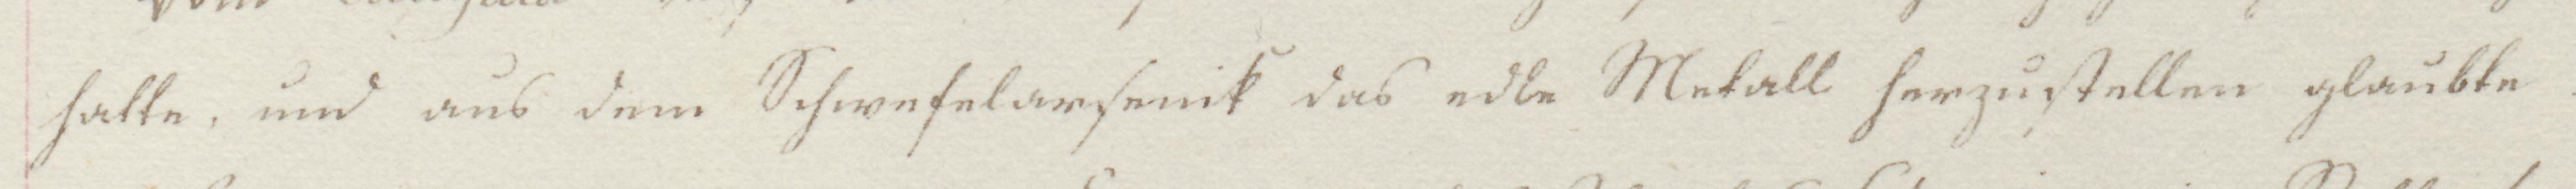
hatte, und aus dem Schwefelarsenik das edle Metall herzustellen glaubte.
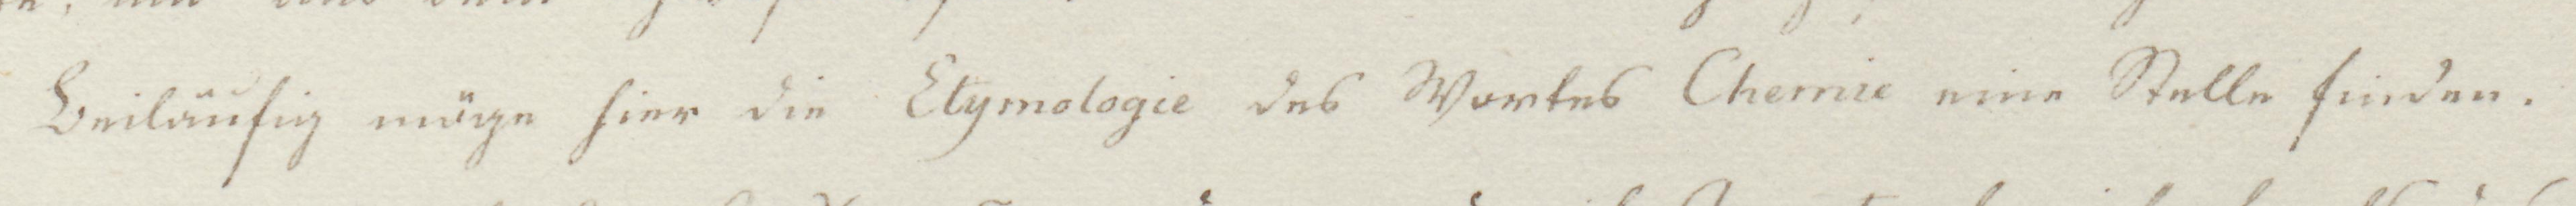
Beiläufig möge hier die Etymologie des Wortes Chemie eine Stelle finden.
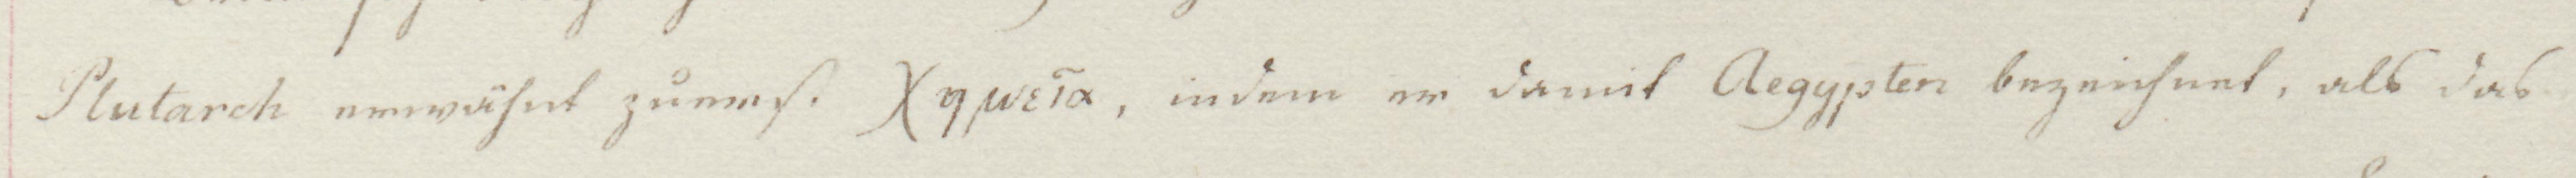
Plutarch erwähnt zuerst χυμεια, indem er damit Aegypten bezeichnet, als das
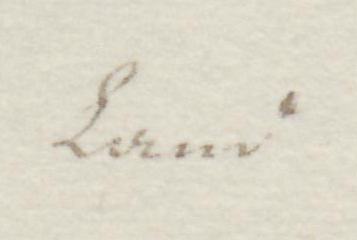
Land
